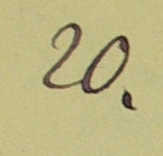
20
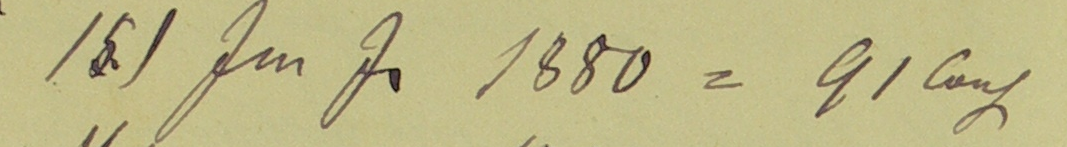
15) Im Jahre 1880 = 91 Consilien
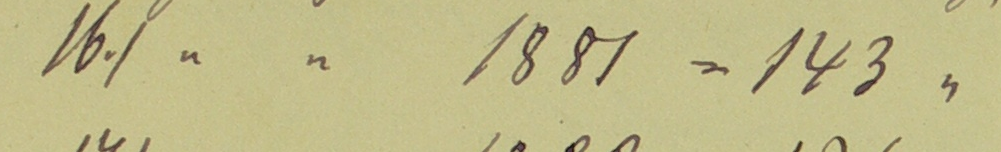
16) * 1881 = 143
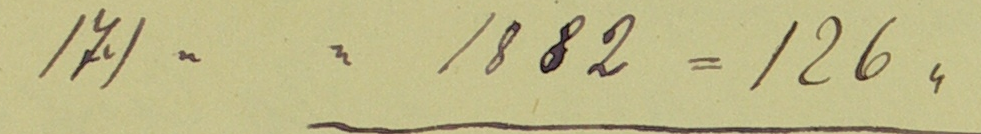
17) * 1882 = 126
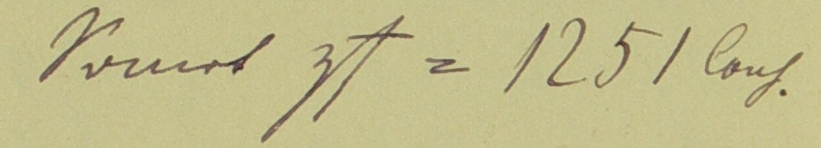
Somit zusammen = 1251 Consilien
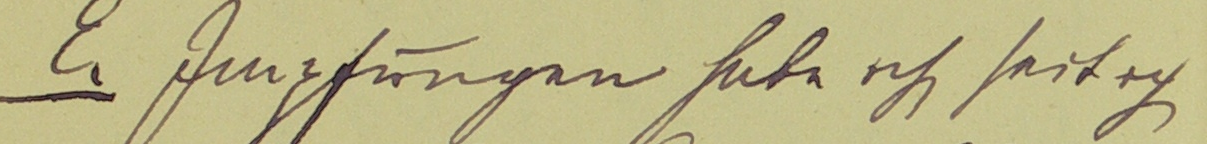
E.) Impfungen habe ich seit ich
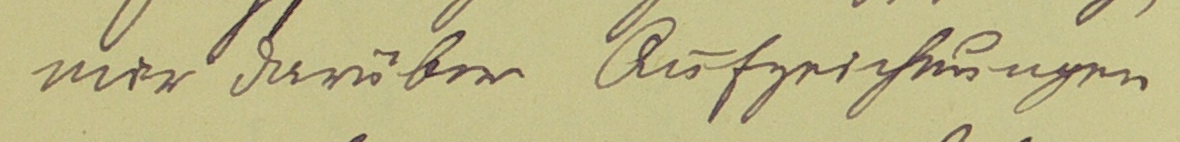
mir darüber Aufzeichnungen
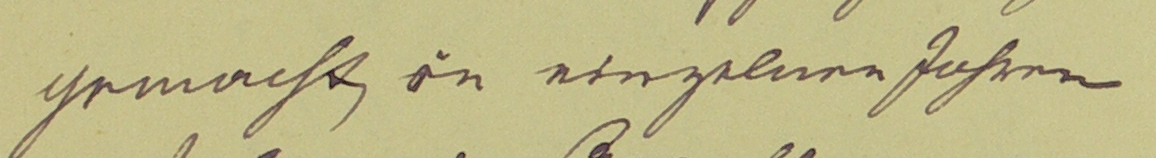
gemacht, in einzelnen Jahre
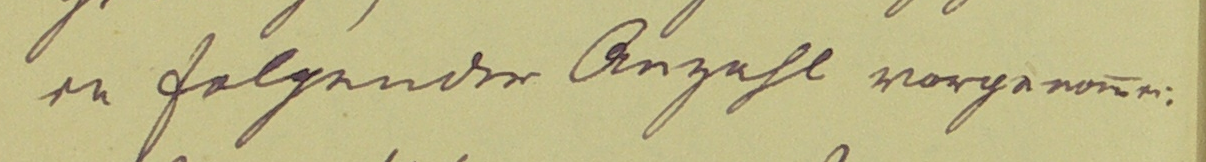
in folgender Anzahl vorgenommen:
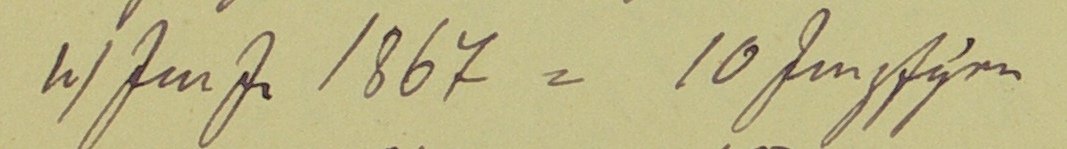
1) Im Jahre 1867 = 10 Impfungen
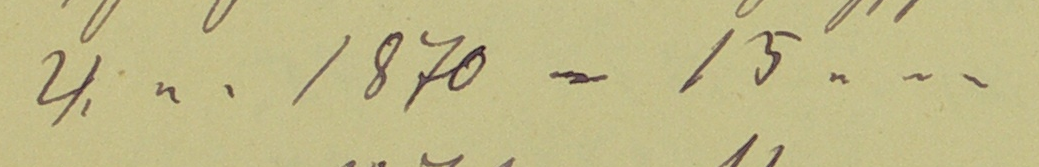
2) * 1870 = 15
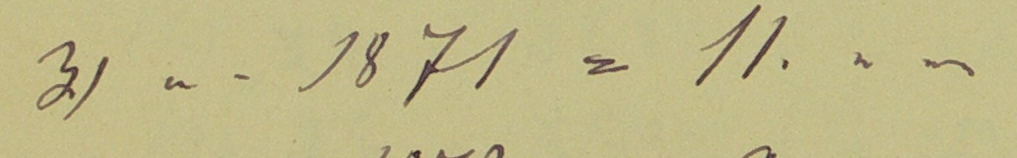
3) * 1871 = 11
